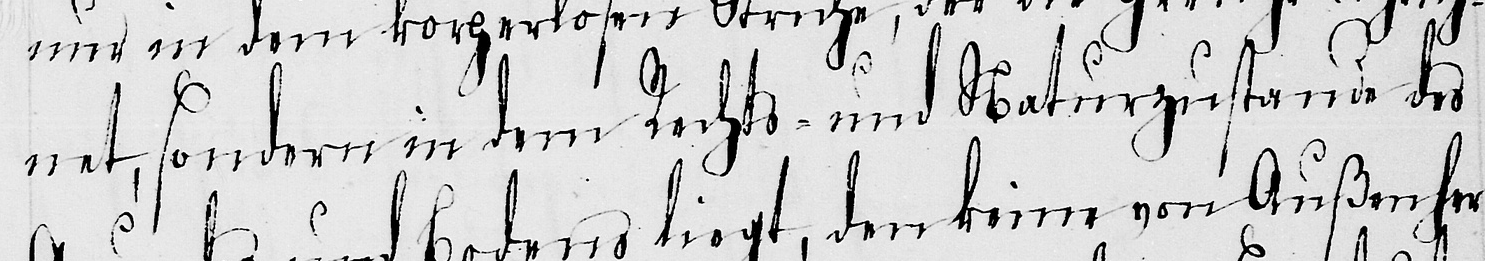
net, sondern in dem Rechts- und Naturzustand des
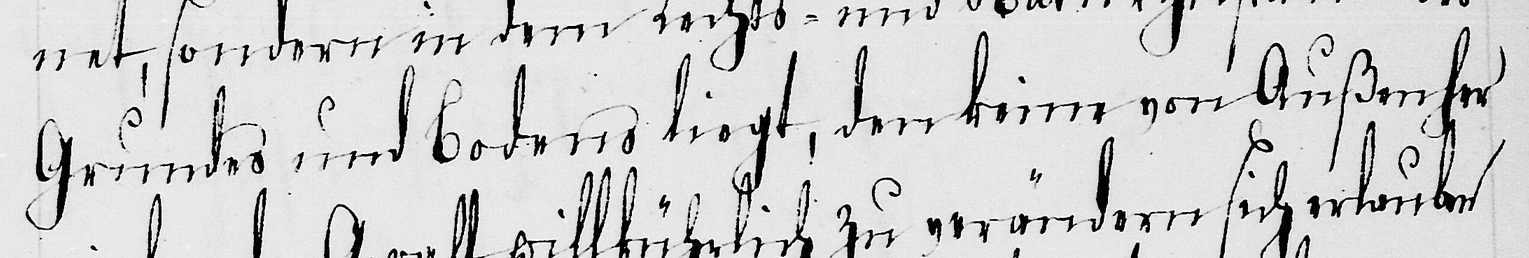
Grundes und Bodens liegt, den keine von Außenher
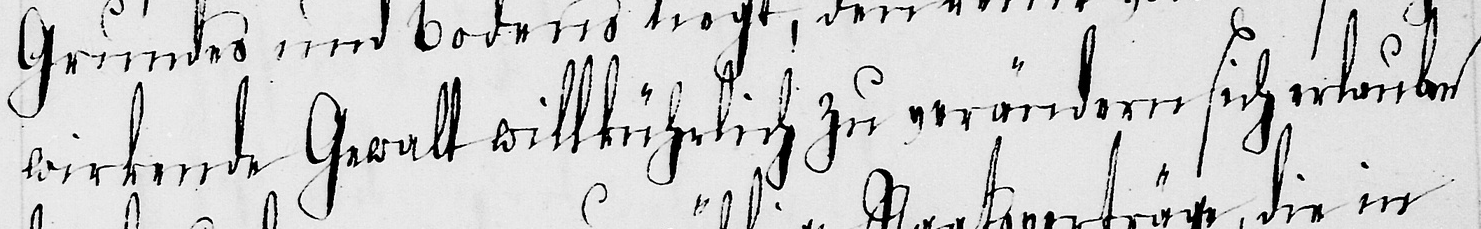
wirkende Gewalt willkührlich zu verändern sich erlaub¬
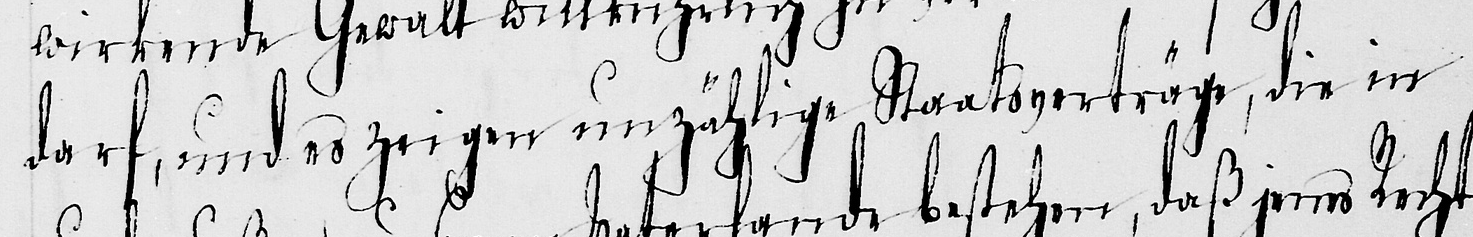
darf, und es zeigen unzählige Staatsverträge, die in
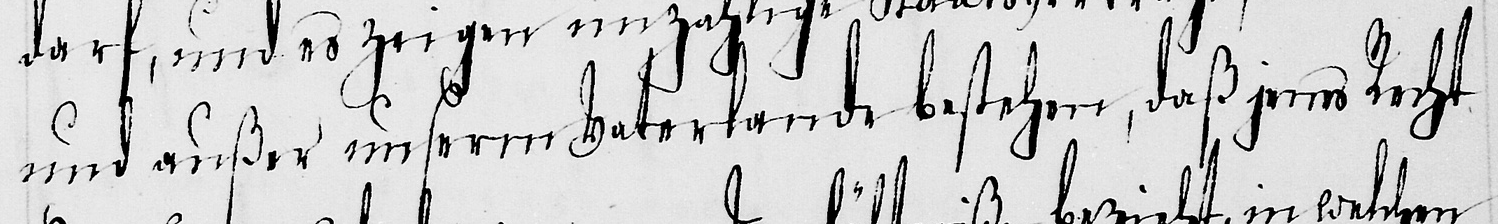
und außer unserm Vaterlande bestehen, daß jenes Recht
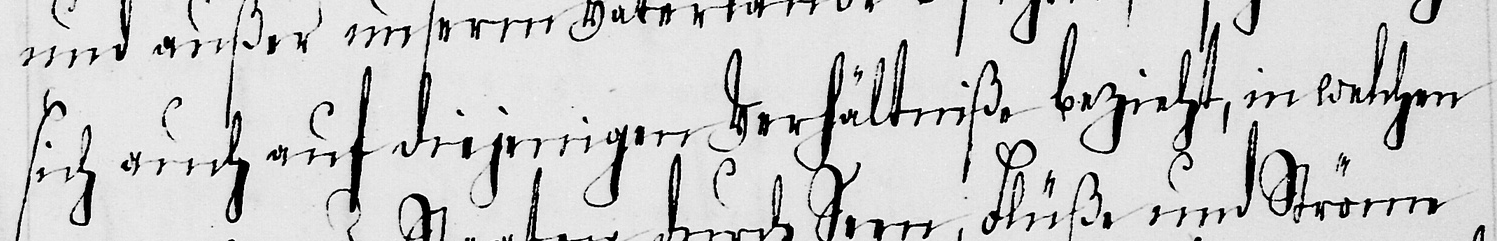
sich auch auf diejenigen Verhältniße bezieht, in welchen
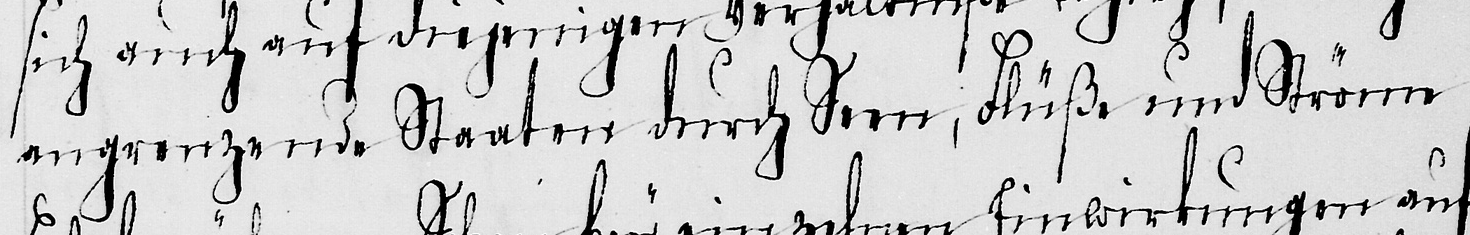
angrenzende Staaten durch Seen, Flüße und Ströme
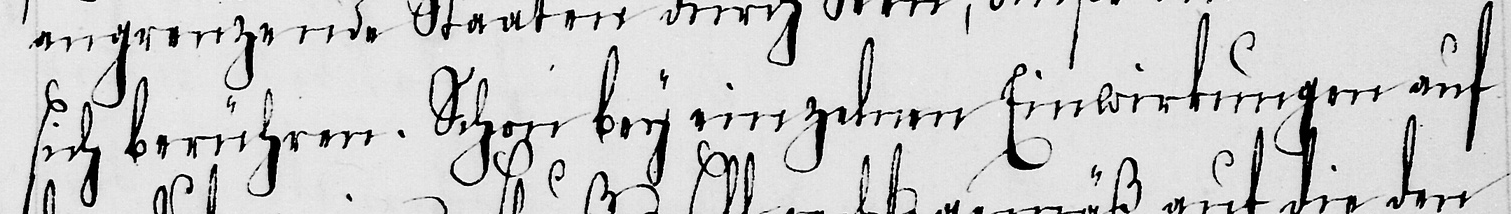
sich berühren. Schon bey einzelnen Einwirkungen auf
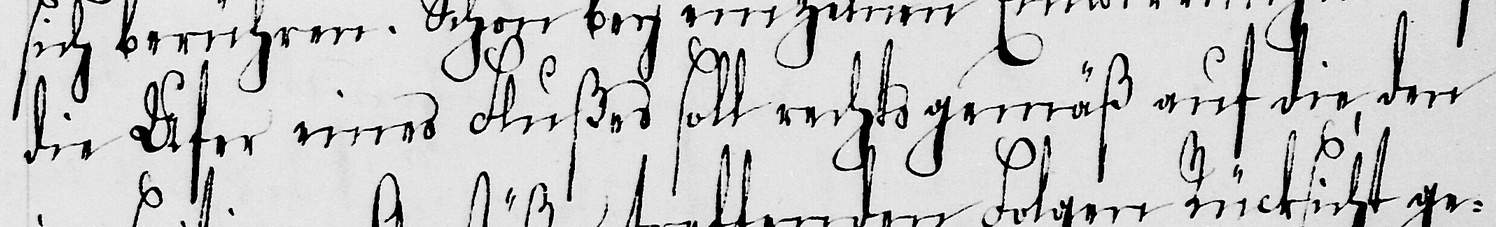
die Ufer eines Flußes soll rechtsgemäß auf die, den
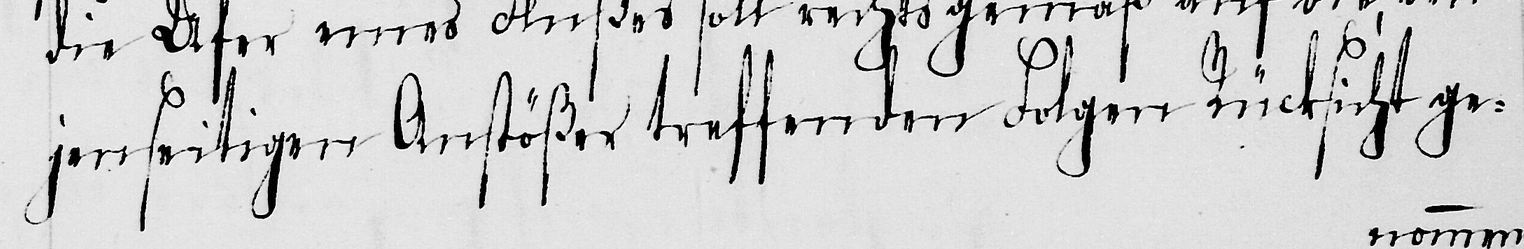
jenseitigen Anstößer treffenden Folgen Rücksicht ge-
